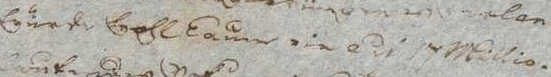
würde wohl kaum ein auf 17 Millio-
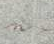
nen
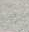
men
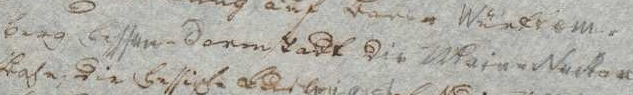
berg, Hessen–Darmstadt, die Main–Neckar
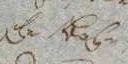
sche Bahn,
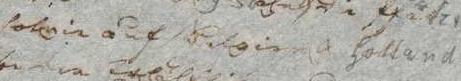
sowie auf Belgien & Holland
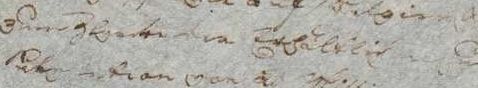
zum Zwecke der Erhältlichmachung der
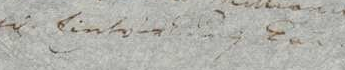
ne solche Einwirkung kann aber
